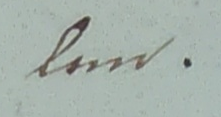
len.
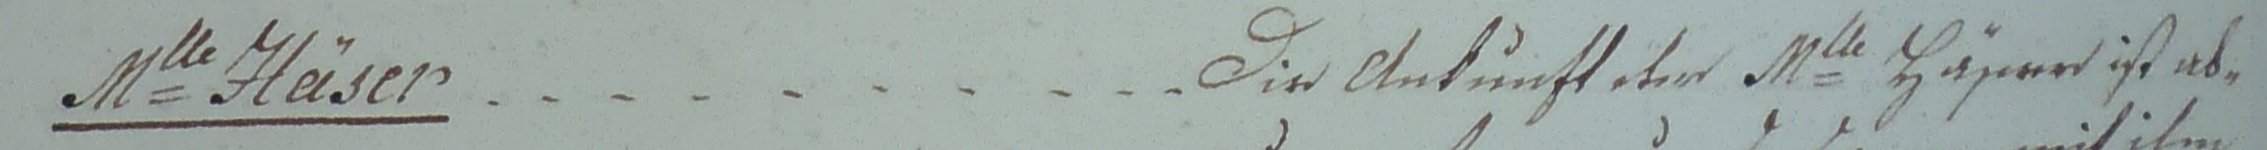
Ml͇l͇e Häser ………… Die Ankunft der Ml͇l͇e Häser ist ab¬
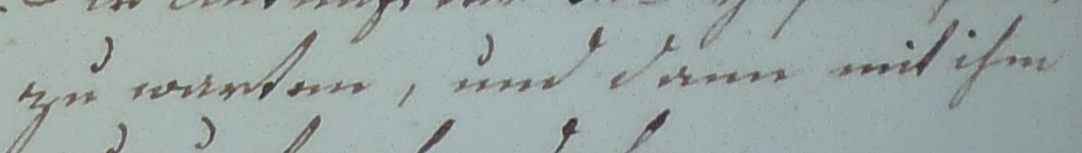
zu warten, und dann mit ihm
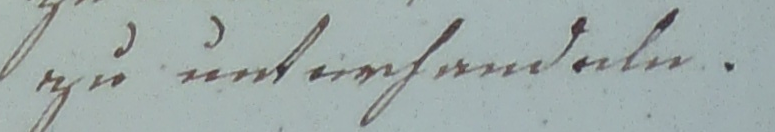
zu unterhandeln.
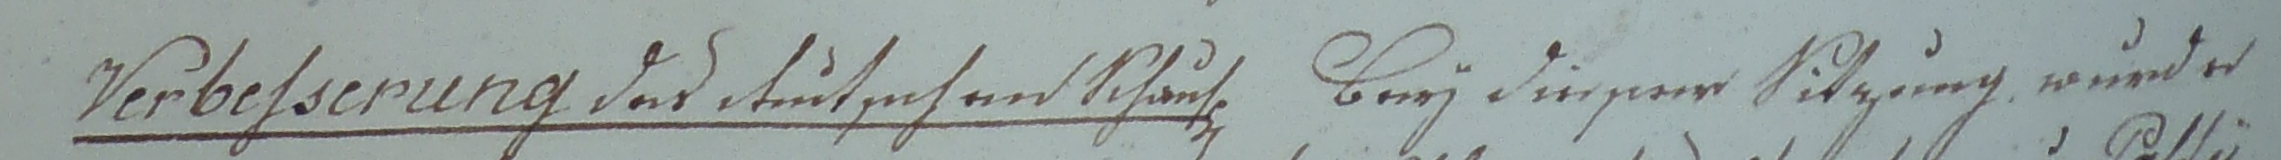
Verbesserung des deutschen SchauspE Bey dieser Sitzung wurde
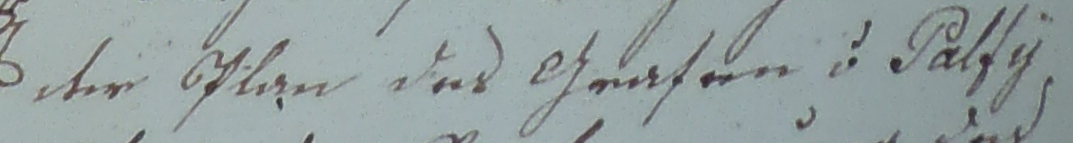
der Plan des Grafen v Palfy
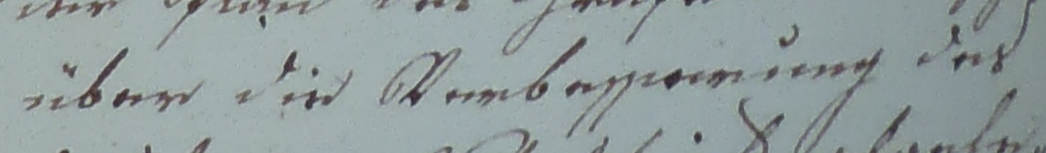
über die Verbesserung des
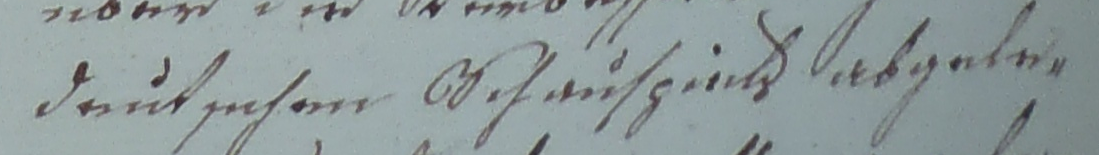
deutschen Schaupiels abgele¬
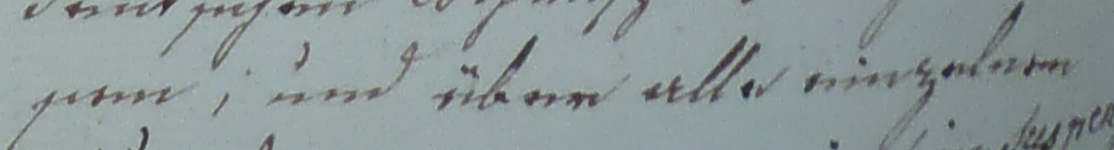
sen, und über alle einzelnen
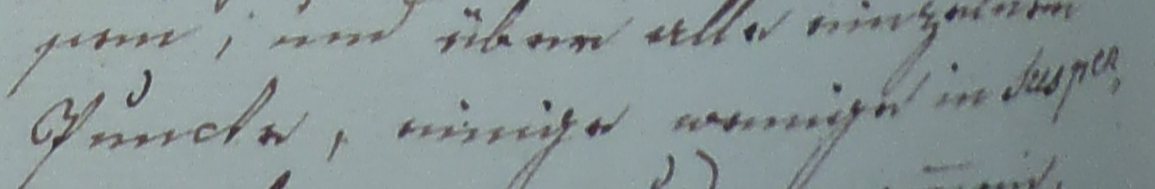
Puncte, einige wenige in Susper¬
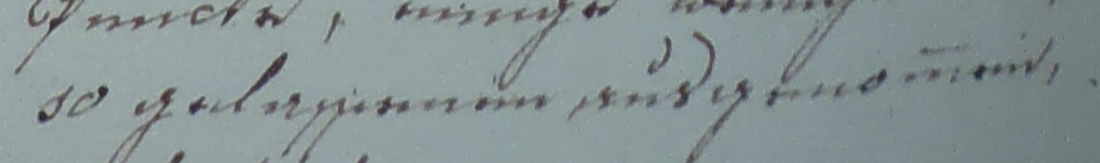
so gelassenen ausgenomen,
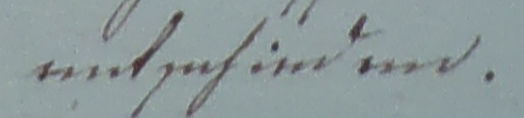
entschieden.
